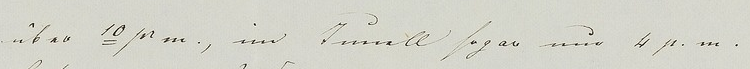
über 10 pr m., im Tunnel sogar um 4 p. m.
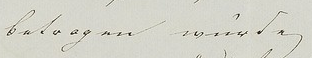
betragen würde.
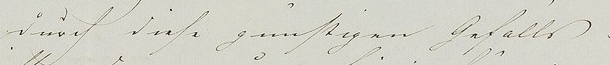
Durch diese günstigen Gefälls-
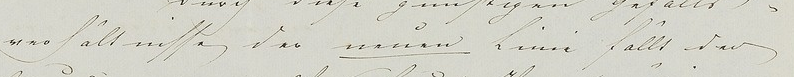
verhältnisse der neuen Linie fällt der
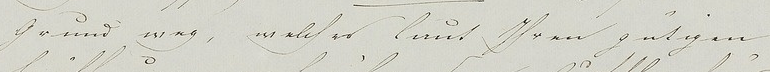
Grund weg, welches laut Ihren gütigen
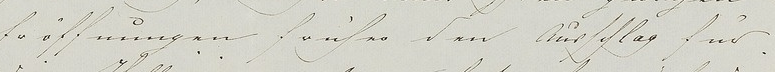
Eröffnungen früher den Ausschlag für
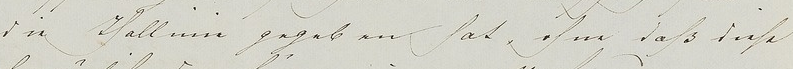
die Thallinie gegeben hat, ohne daß diese
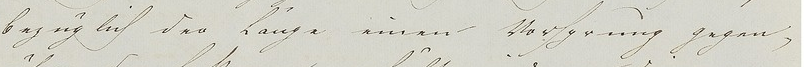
bezüglich der Länge einen Vorsprung gegen-
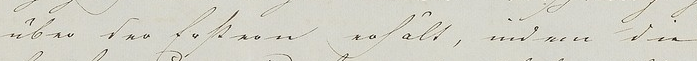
über der Ersteren erhält, indem die
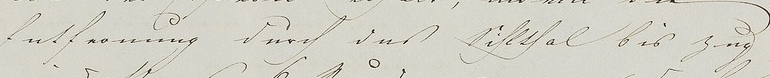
Entfernung durch das Sihlthal bis Zug
